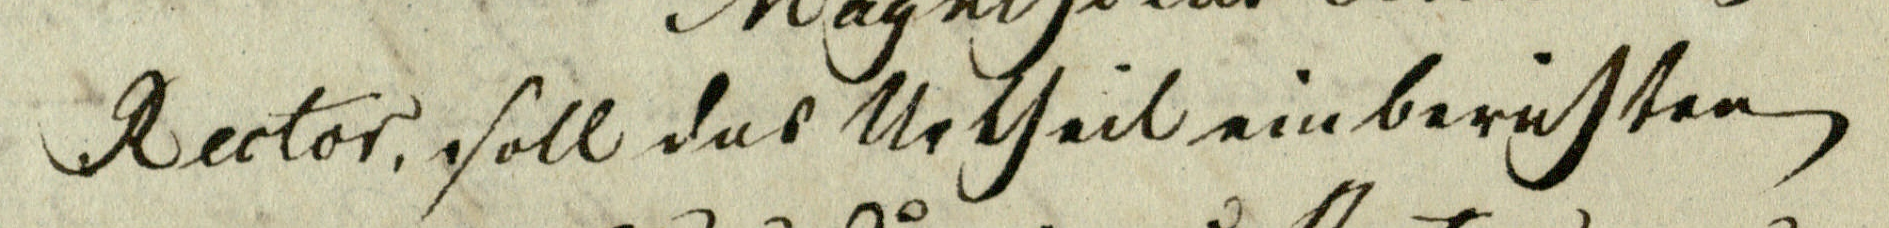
Rector, soll das Urtheil einberichten.
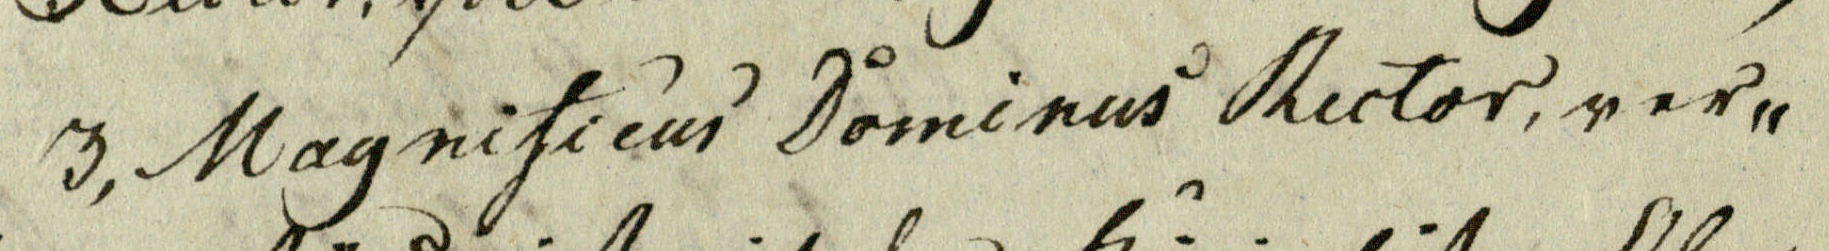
Magnificus Dominus Rector, ver¬
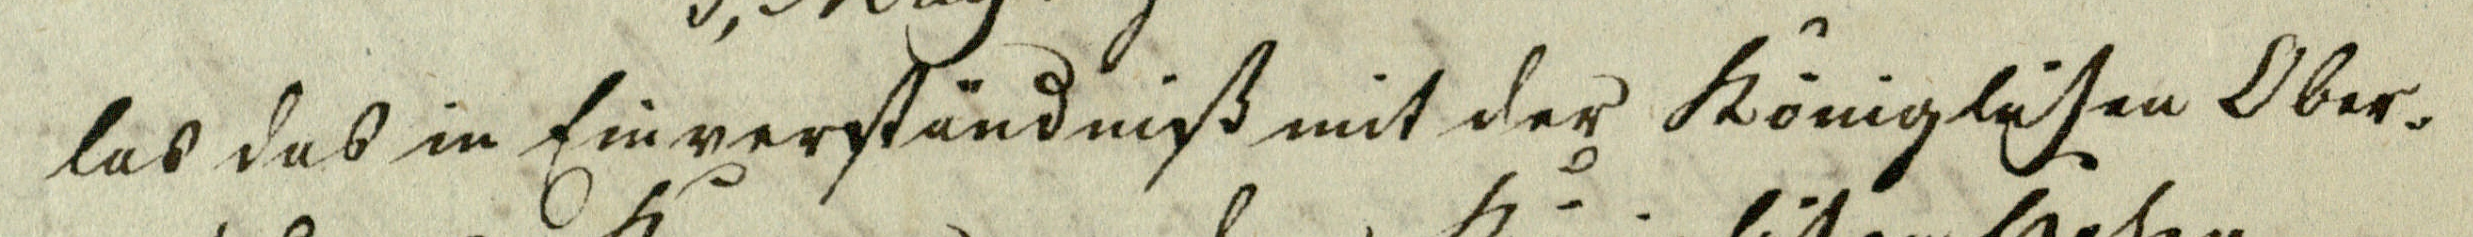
las das in Eiverständniß mit der Königlichen Ober¬
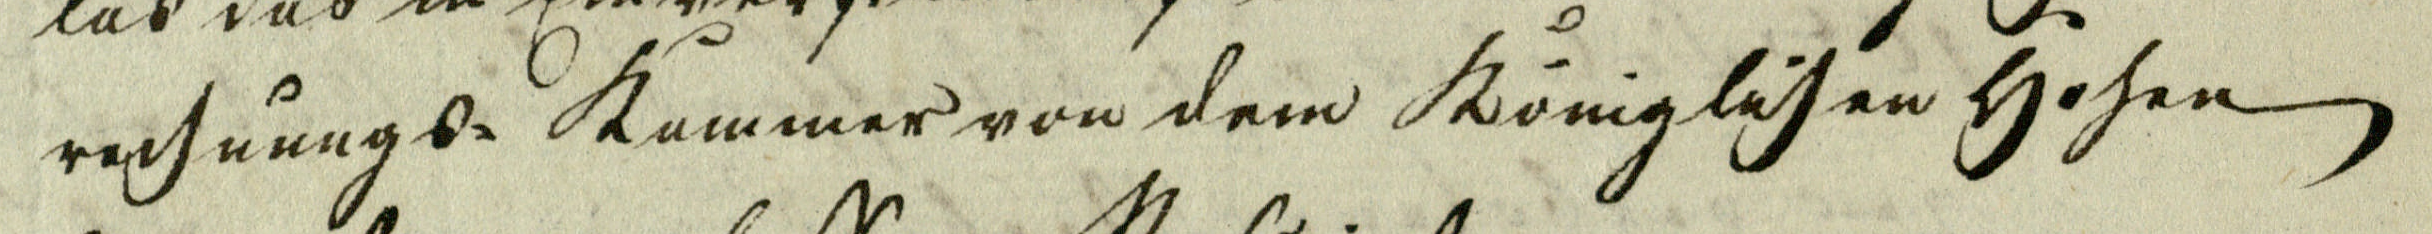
rechnungs-Kammer von dem Königlichen Hohen
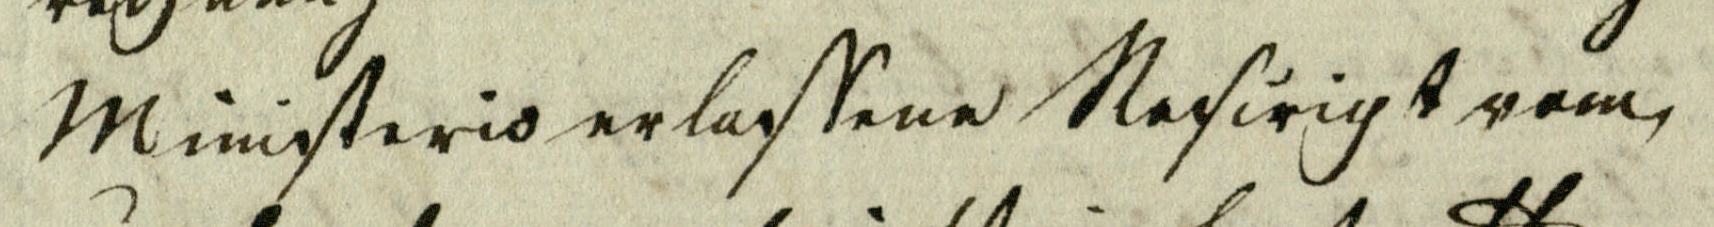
Ministerio erlassene Rescript vom
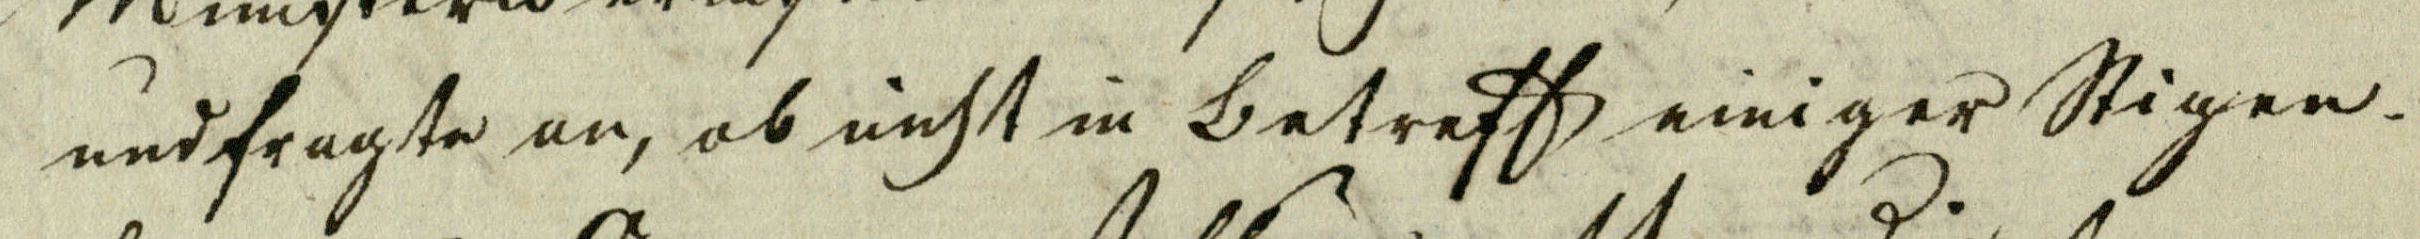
und fragte an, ob nicht in Betreff einiger Stipen¬
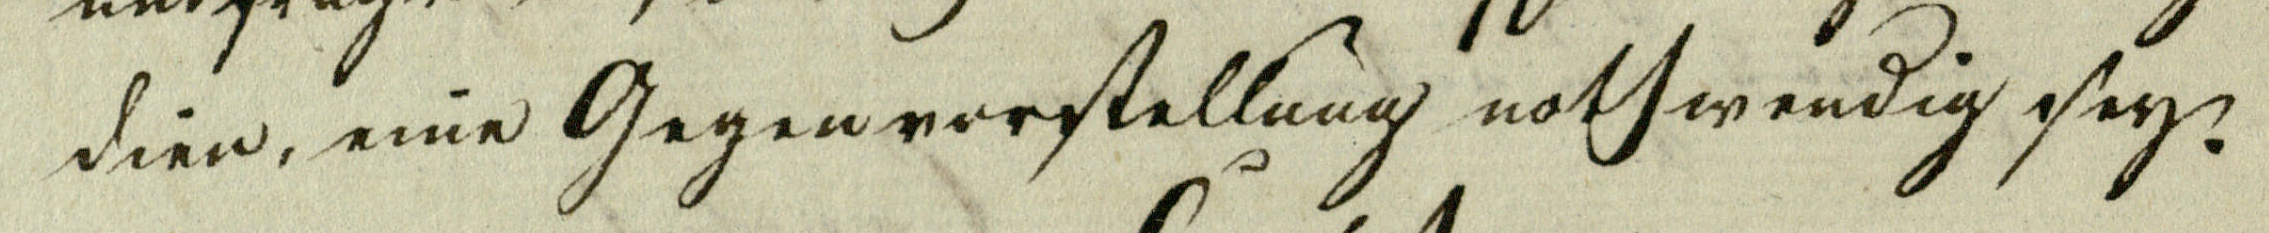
dien, eine Gegenvorstellung nothwendig sey.
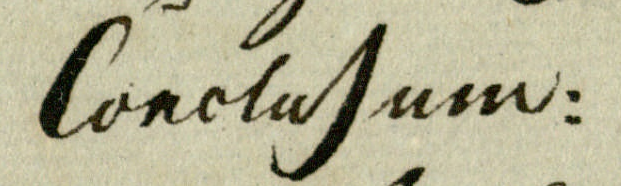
Conclusum:
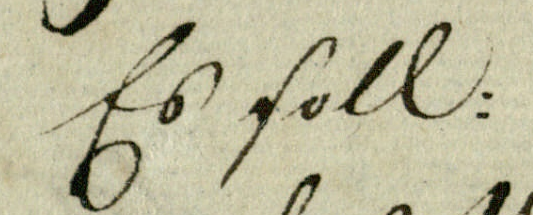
Es soll:
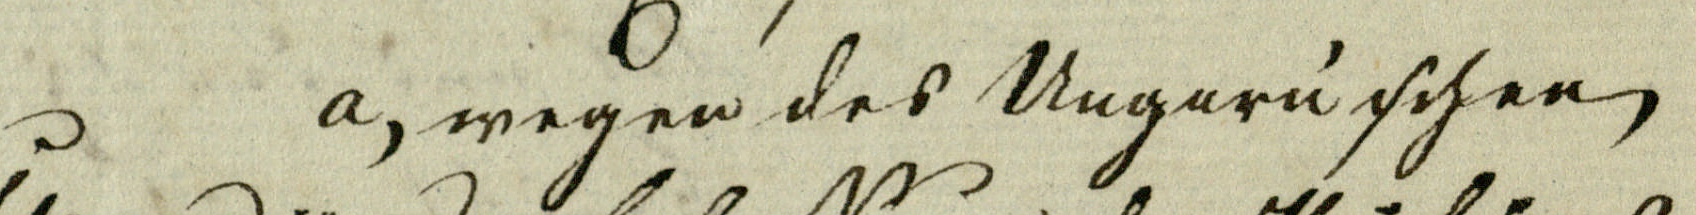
a, wegen des Ungarischen
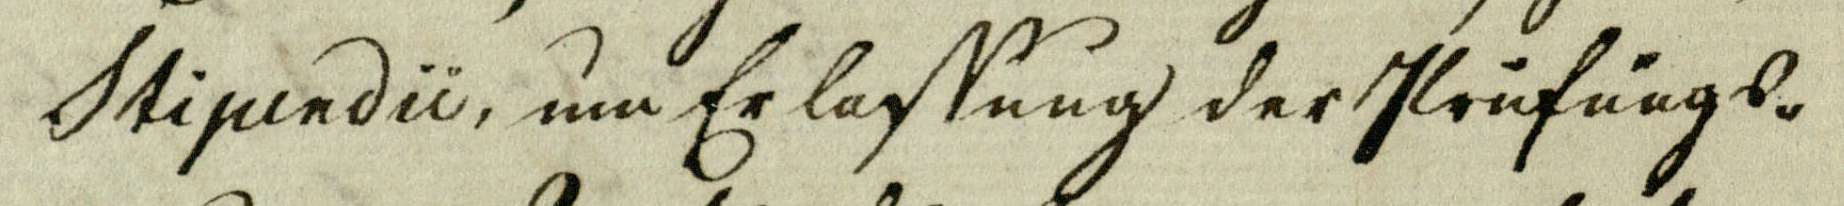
Stipendii, um Erlassung der Prüfungs¬
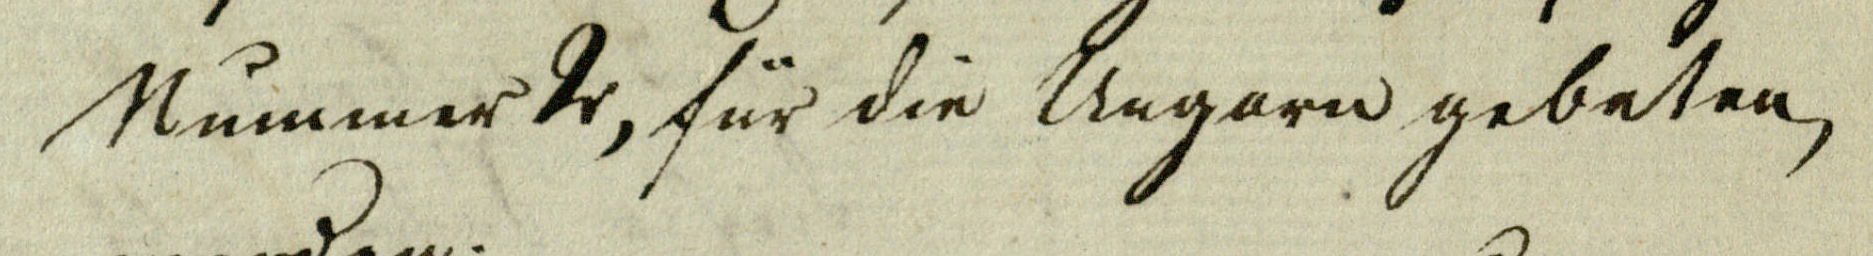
Nummer 2, für die Ungarn gebeten,
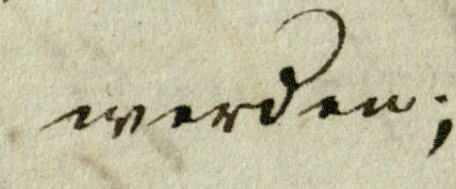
werden;
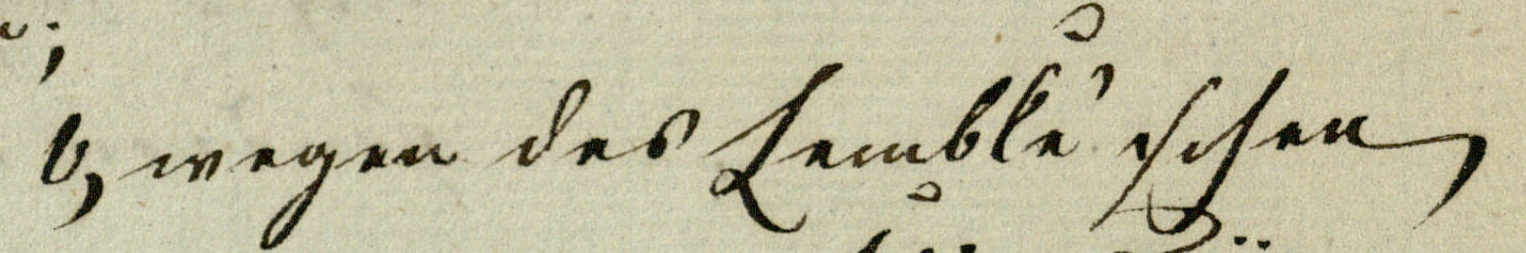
b, wegen des Lembke'schen
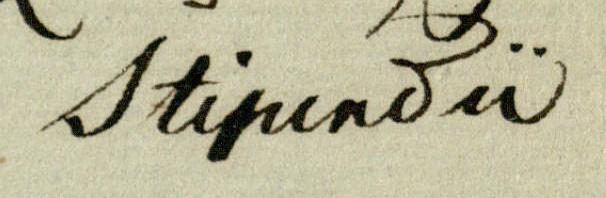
Stipendii
